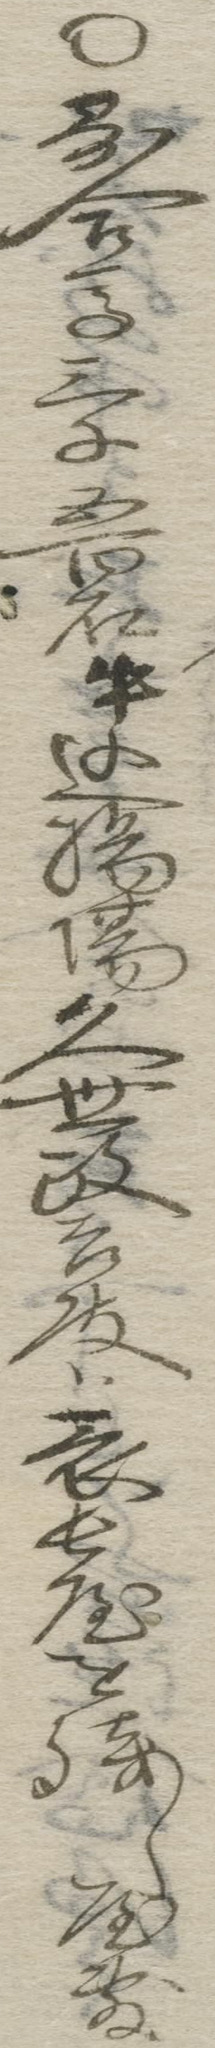○寄合高三千五百石牛込揚場久世政吉殿ハ表長屋を残し屋敷
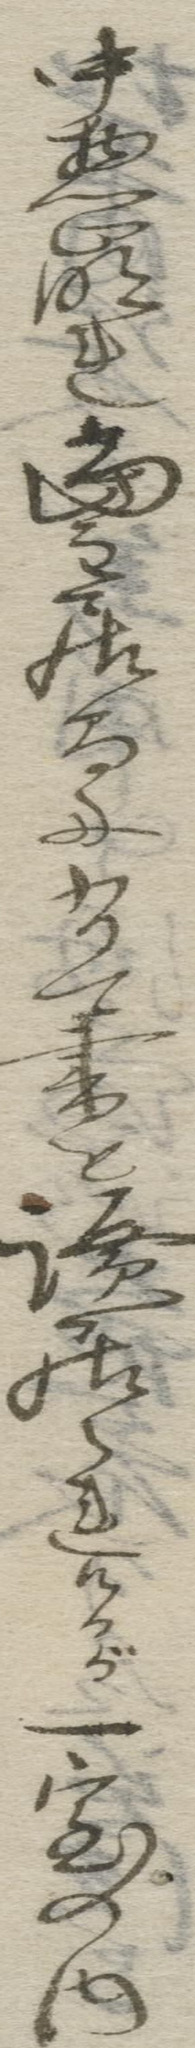中惣崩れ当主居間に有て書を読居られけるが一室の内
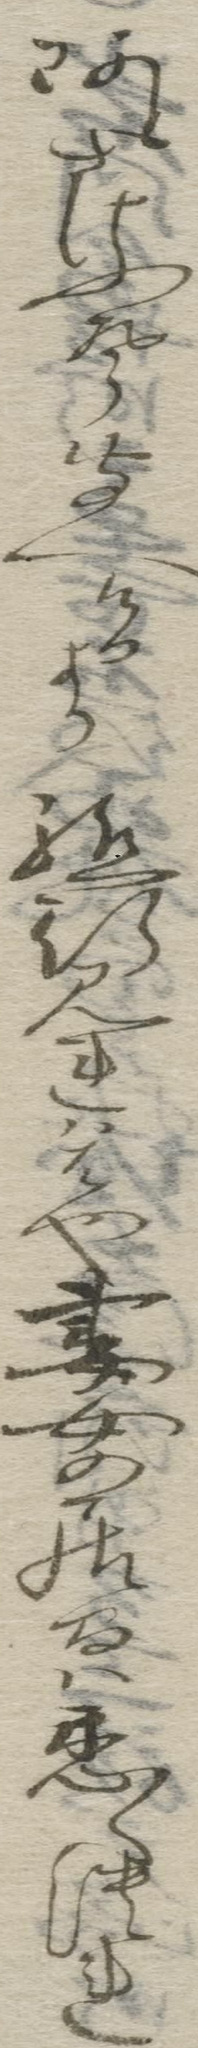あとさけふ声聞へけるより駆行見れハはや妻女の居間ハ悉く潰れ
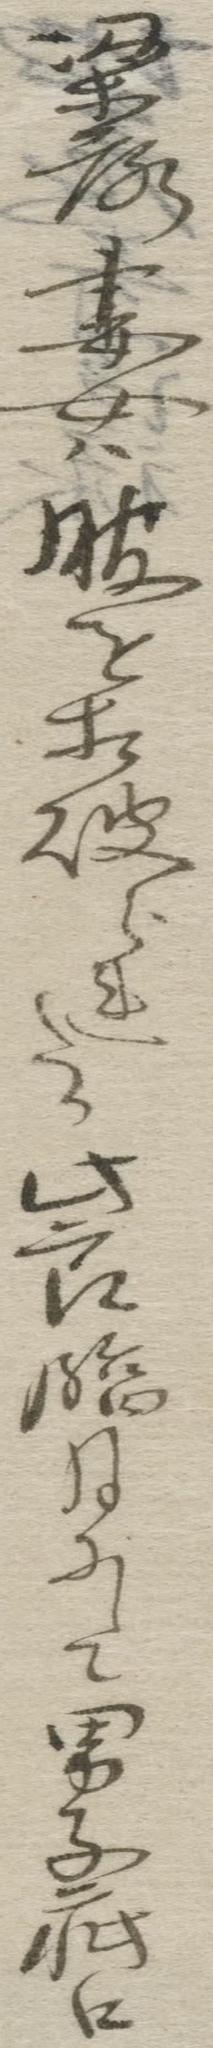梁落妻女は腹を相破られたり此節臨月にして男子疵口
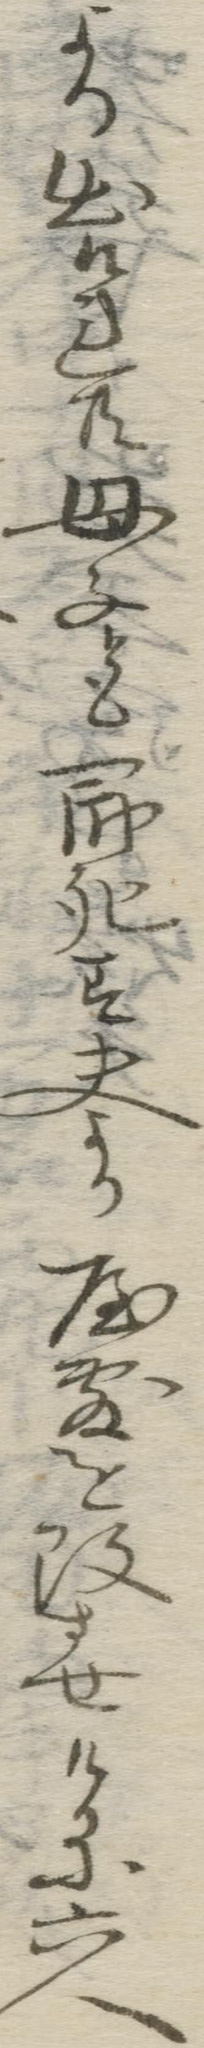より出けれ共母子とも即死す夫より屋敷を改させけるに六人
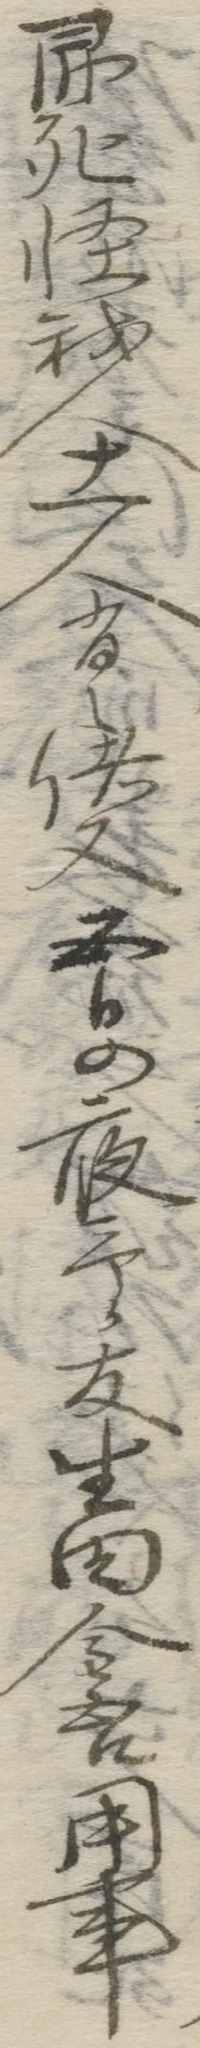即死怪我人十一人有之偖又五日の夜予か友生田金吾用事
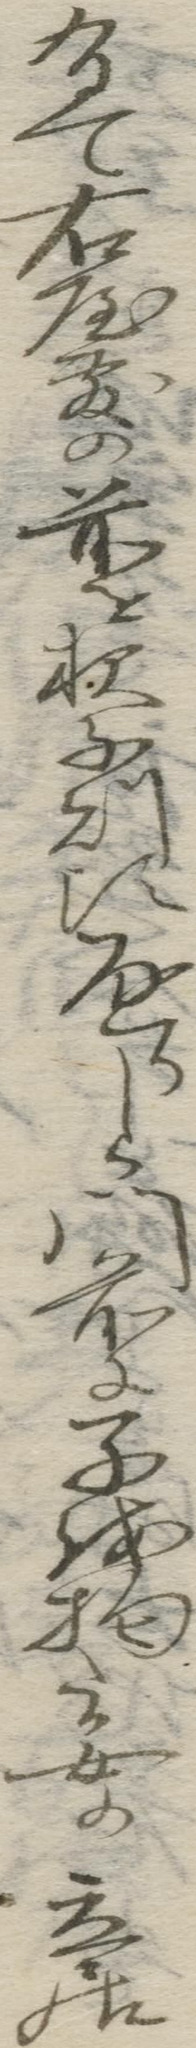有て右屋敷の前を夜子刻頃通りしか門前に子を抱たる女の立居
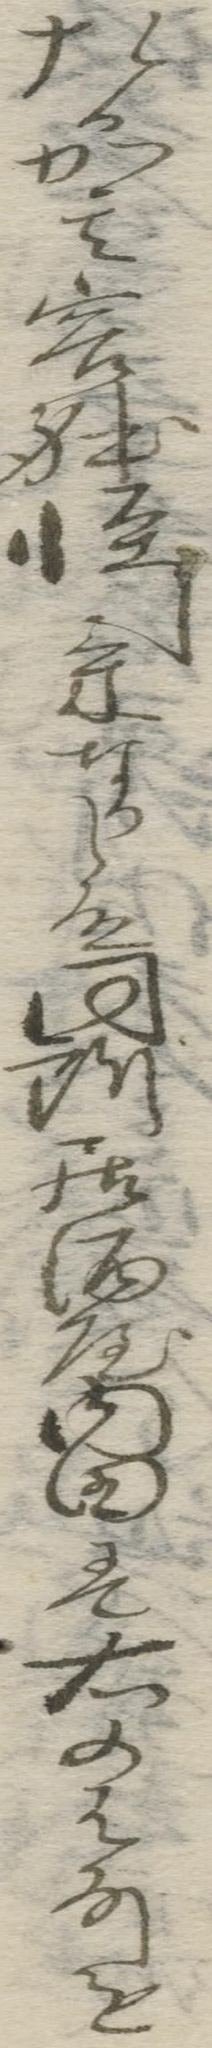たるか其容体怪し気なりし故同所居酒屋内田にて右のはなしを
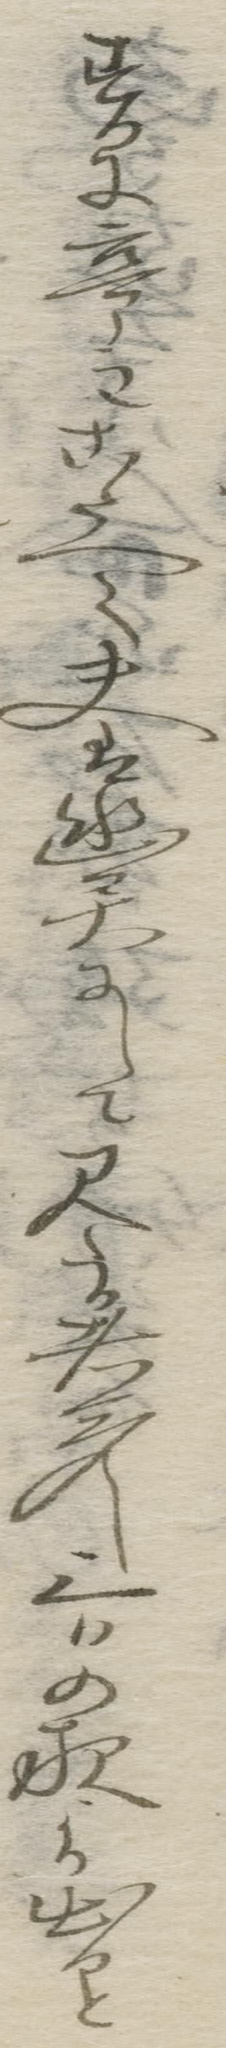するに亭主こたへて夫は幽霊にして見たる者多し三日の夜より出ると
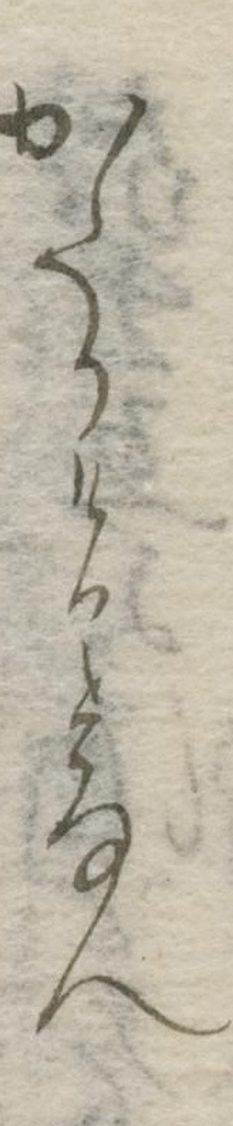かたりけるとなん
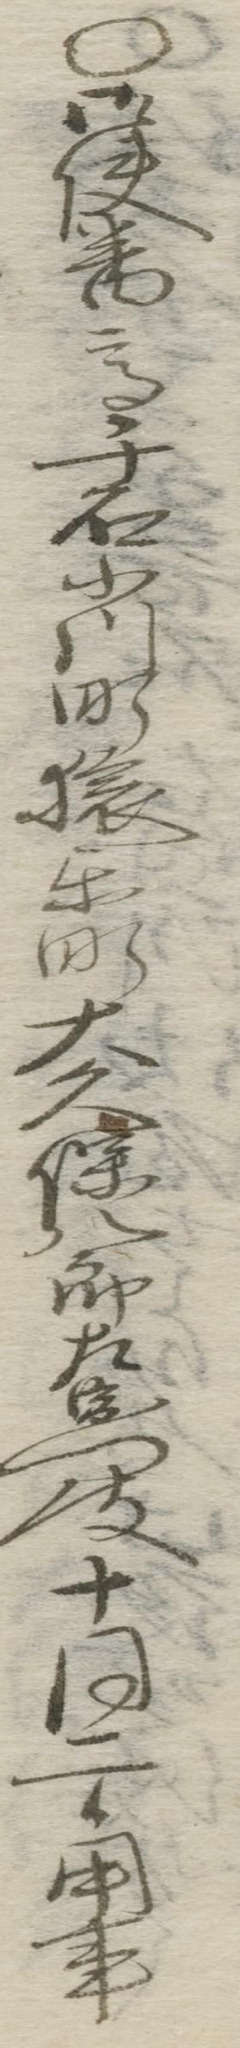○御使番高千石小川町猿楽町大久保八郎左衛門殿十月二日用事
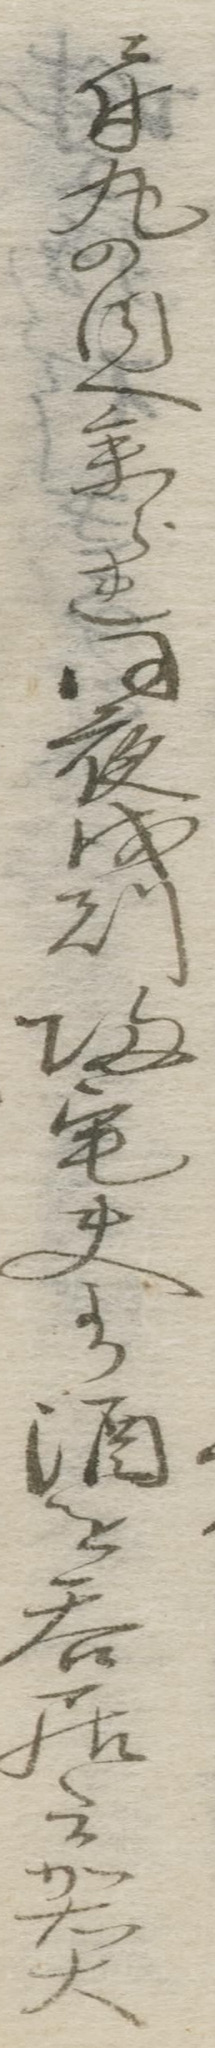ニ付丸の内へ参られ同夜戌刻帰宅夫より酒を呑居たるか右大
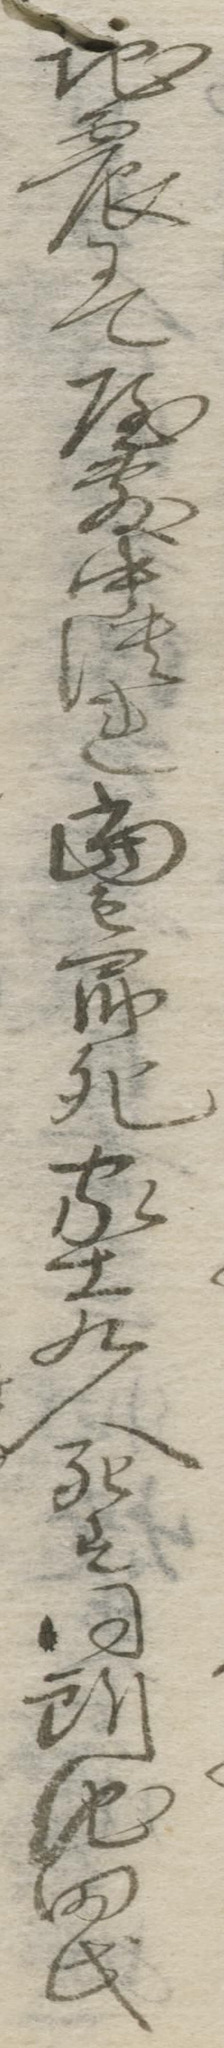地震にて屋敷中潰れ当主即死家士九人死す同所池田氏
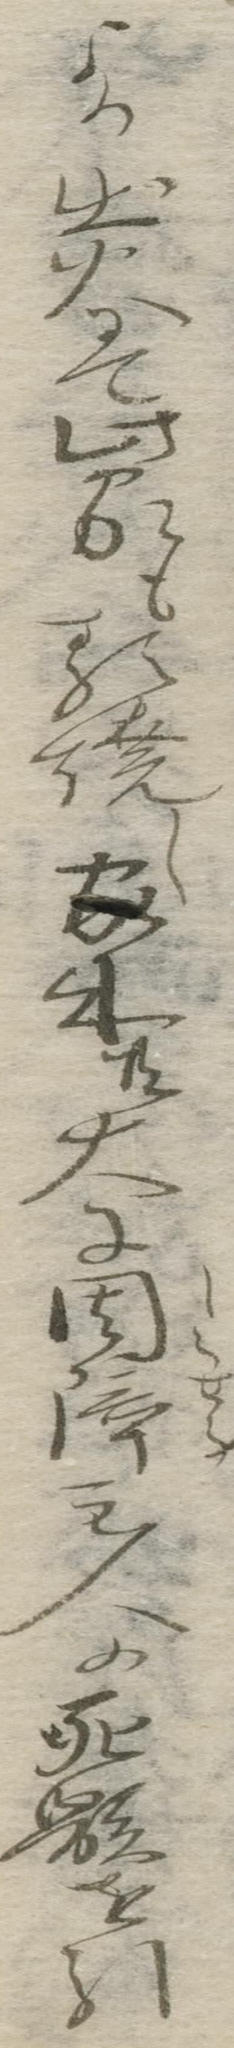より出火にて此家も類焼し家来共大に周障主人の死骸を引

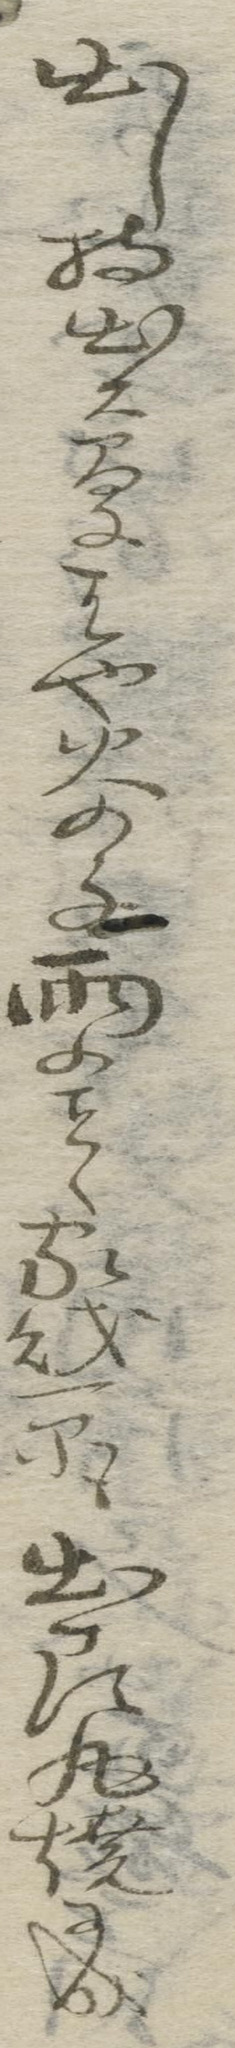出し持出す間にはや火の手雨のことく家財一品も出さす丸焼に成
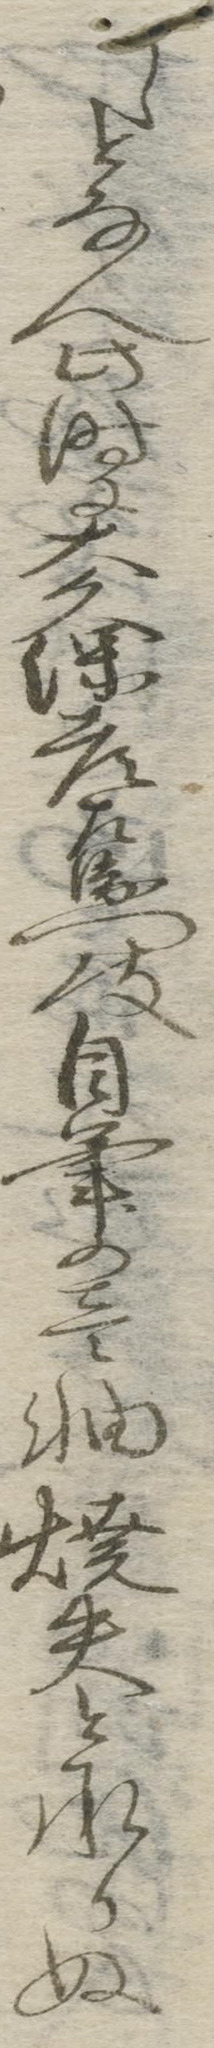しとなん此時に大久保彦左衛門殿自筆の壱軸焼失と承りぬ
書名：江戸中諸屋敷　地震竒談録
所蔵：東京大学地震研究所図書室 Earthquake Research Institute Library, The University of Tokyo, JAPAN
